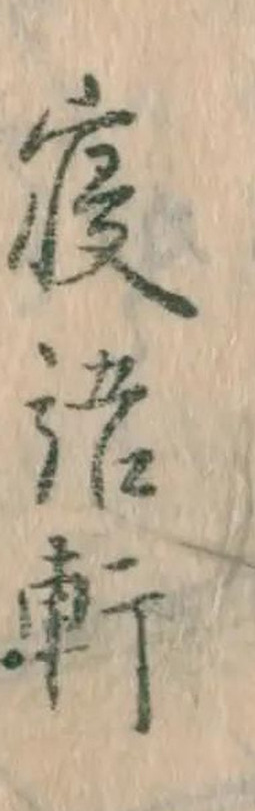寝語軒

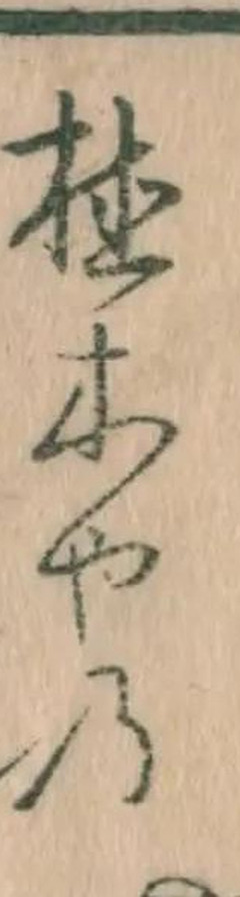植木やの
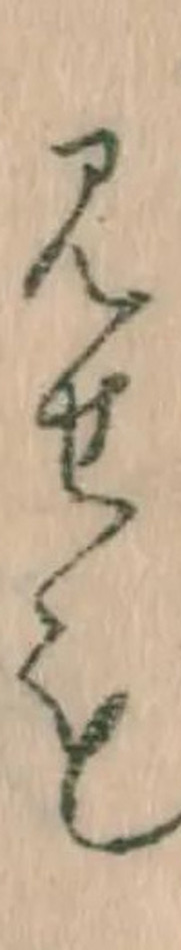みせも
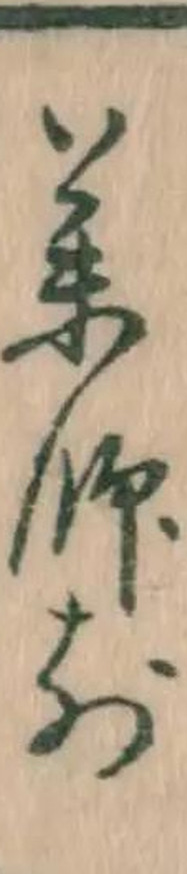薬師前
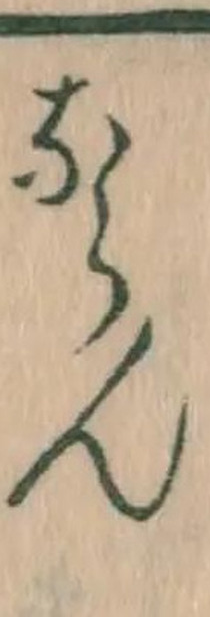ならん
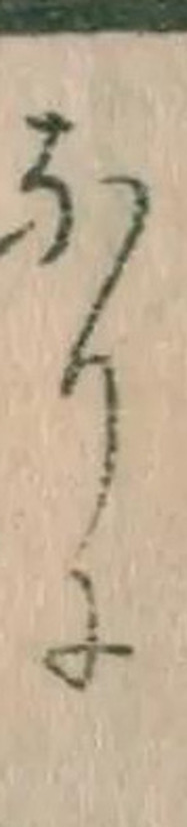なりに
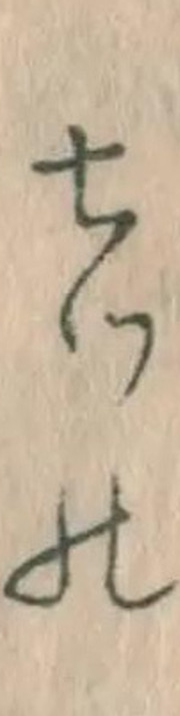七ツの
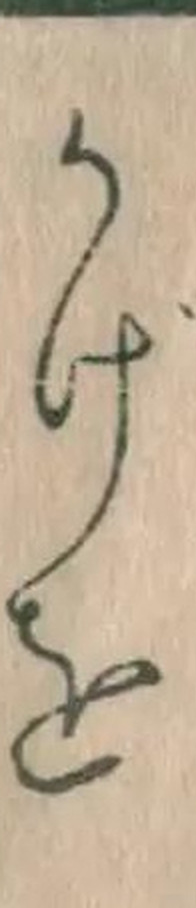かげを

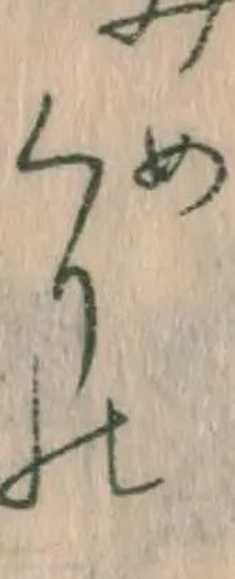くりの
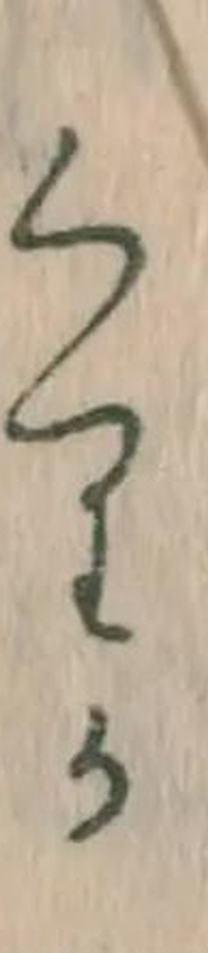くりか
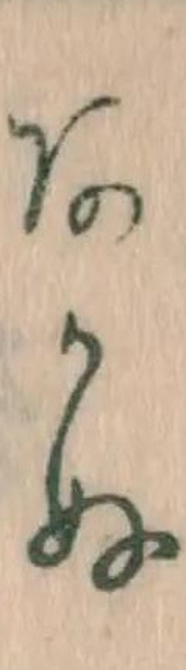あかぬ

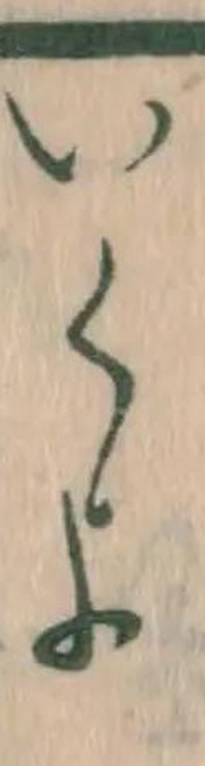いくよ
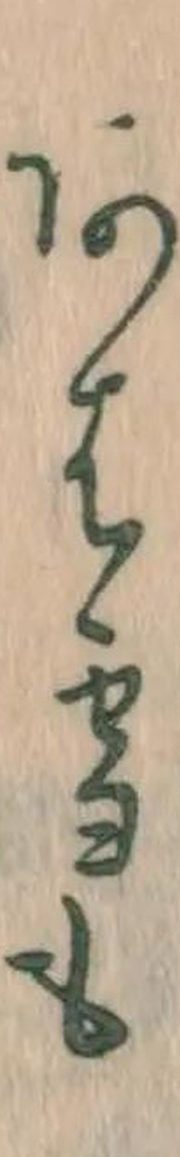あは雪も

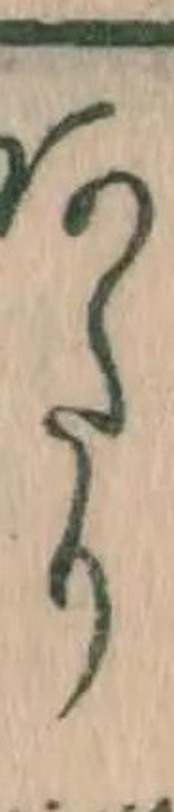あたり
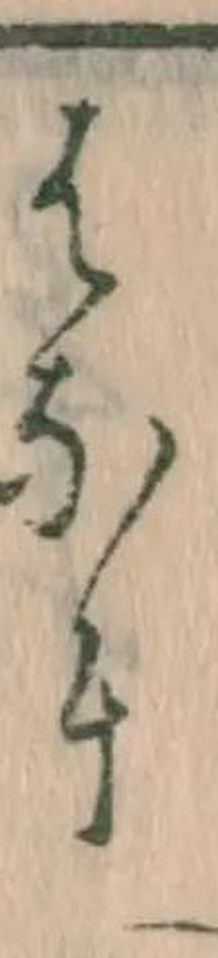はなに
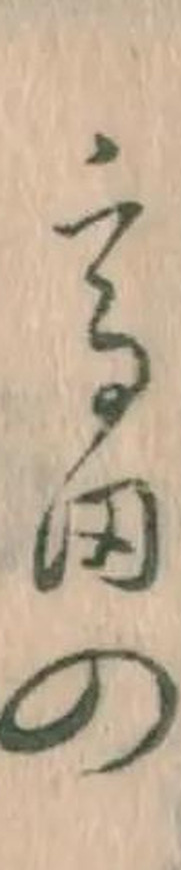高田の
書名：駿河舞 3巻
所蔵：国立国会図書館 National Diet Library, JAPAN
